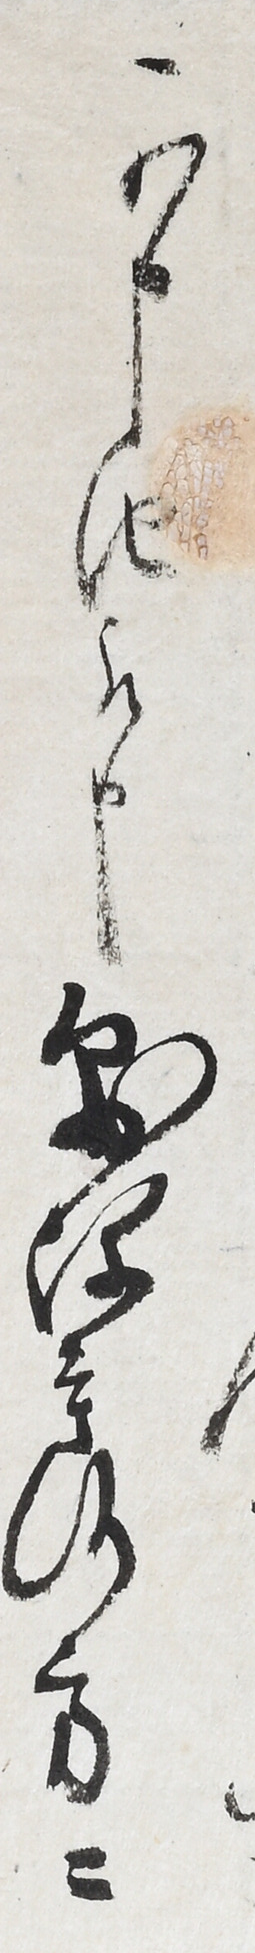可申由被申則弥平治方ニ
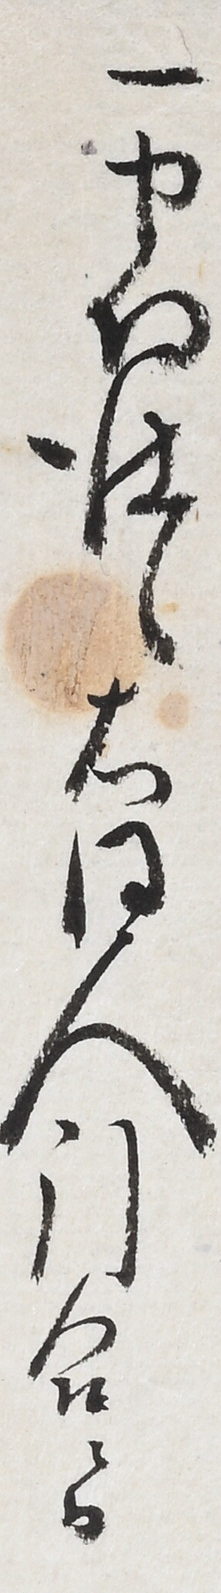一宿仕候右同人引合ニ而
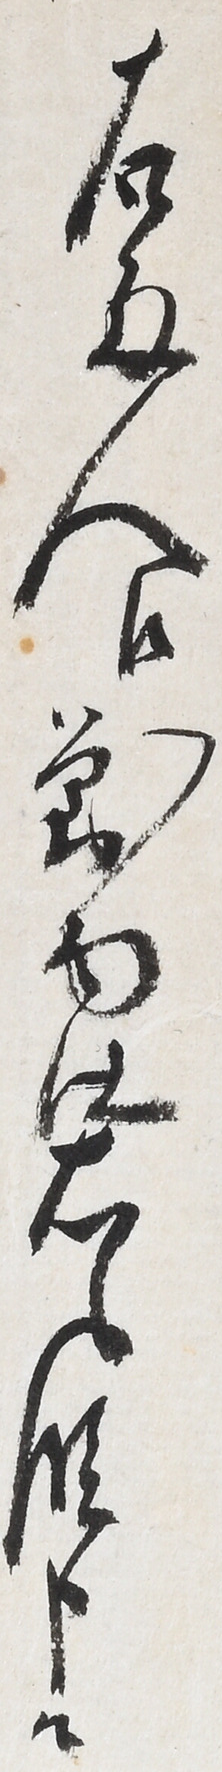右両人え対面仕右之段申候
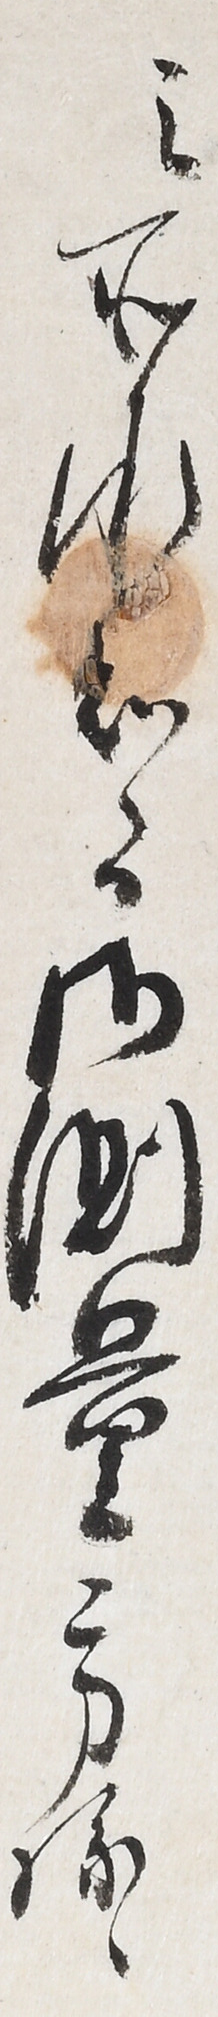之所承知ニ而御側量方様へ
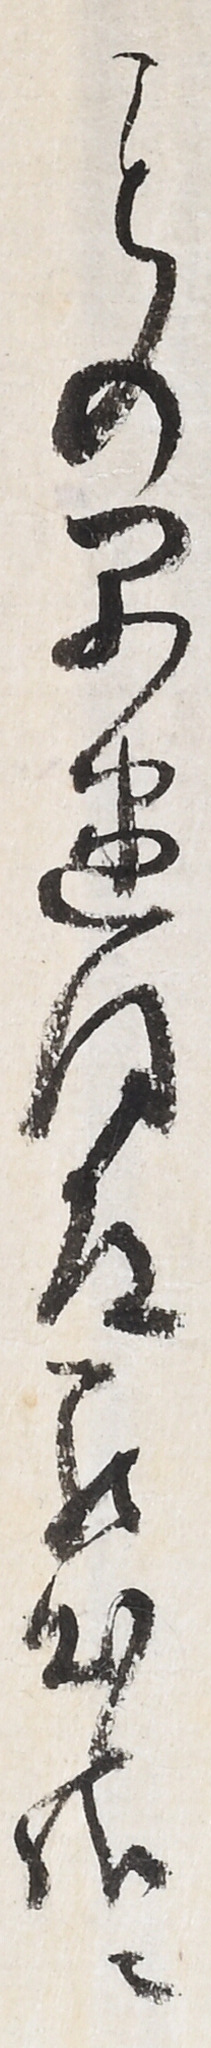もの早速同道罷出候様ニ
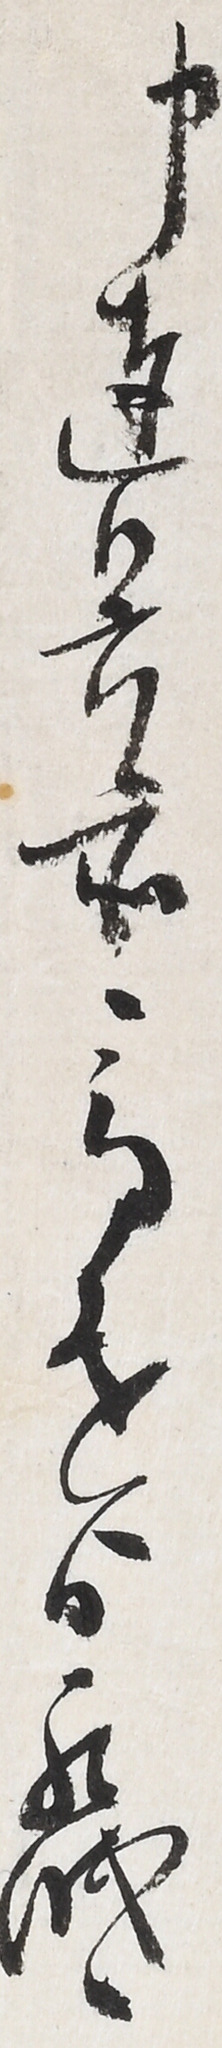申達御座候所高遠ゟ罷越候
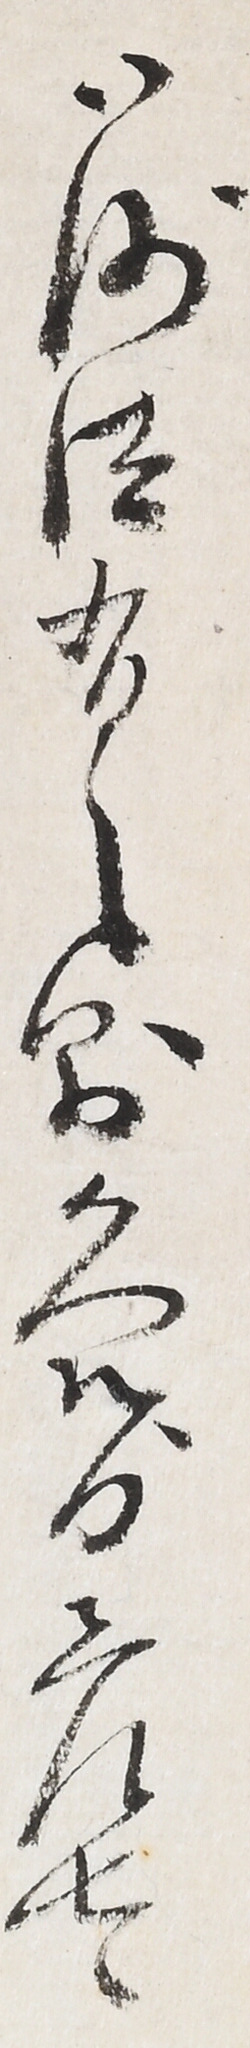御沙汰有之候則久左衛門彦七ニ
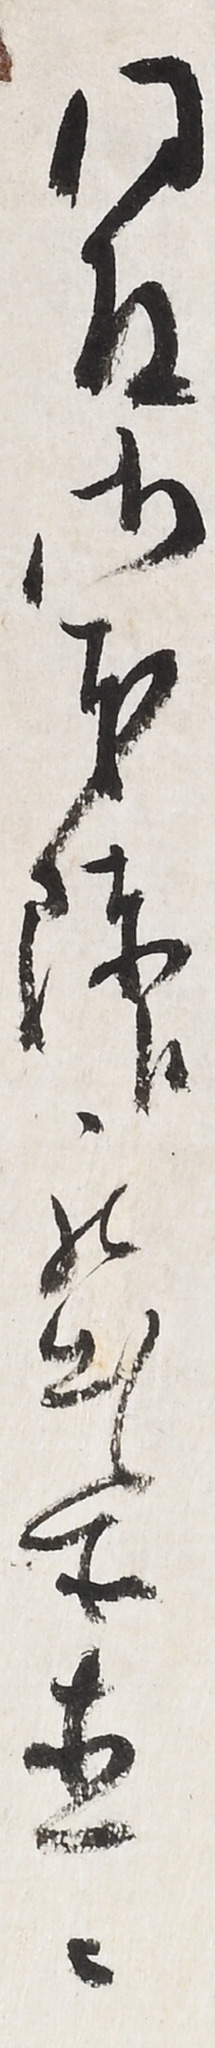同道御本陣え罷出候所直ニ
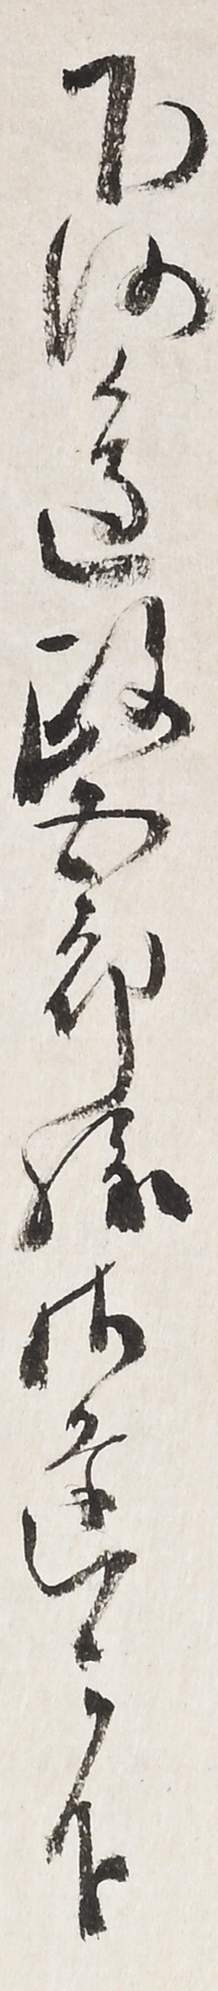下河辺政五郎様御逢被下
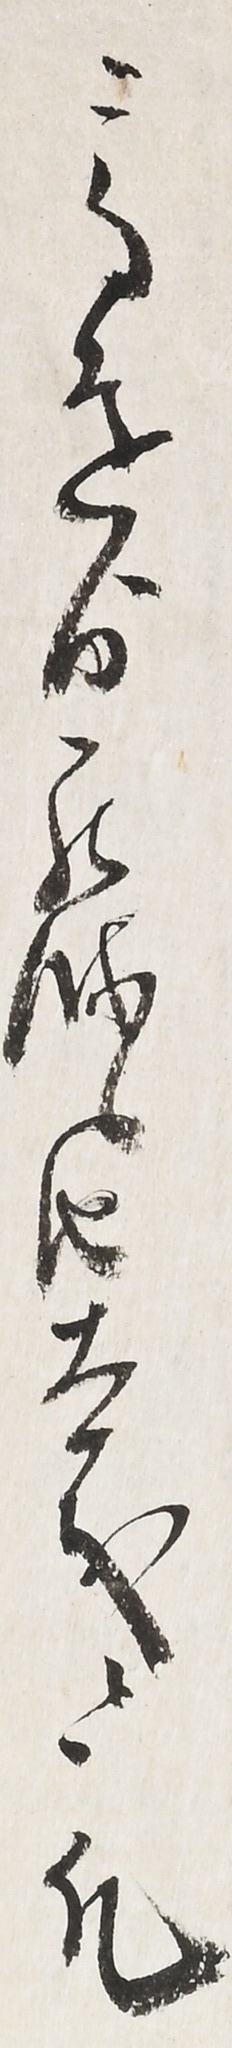高遠ゟ罷越候由太義ニ候凡
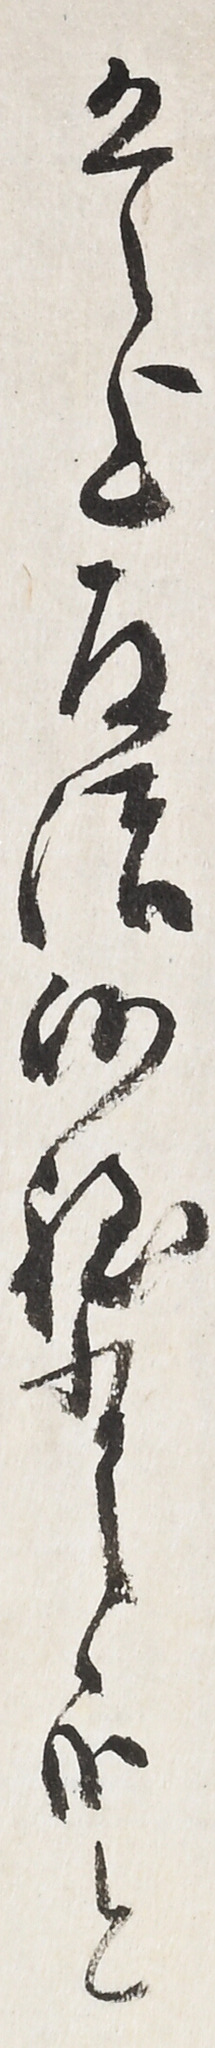是迄道法何程有之候哉と
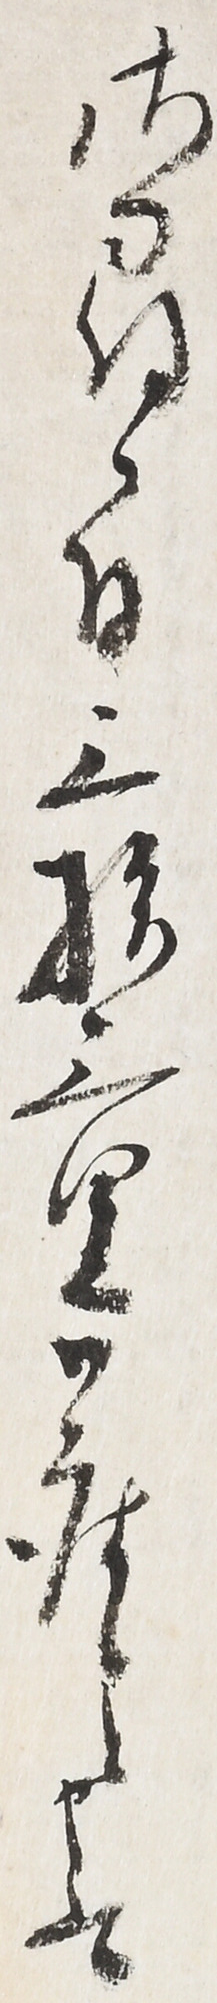御尋ニ付三拾三里御座候と申上候
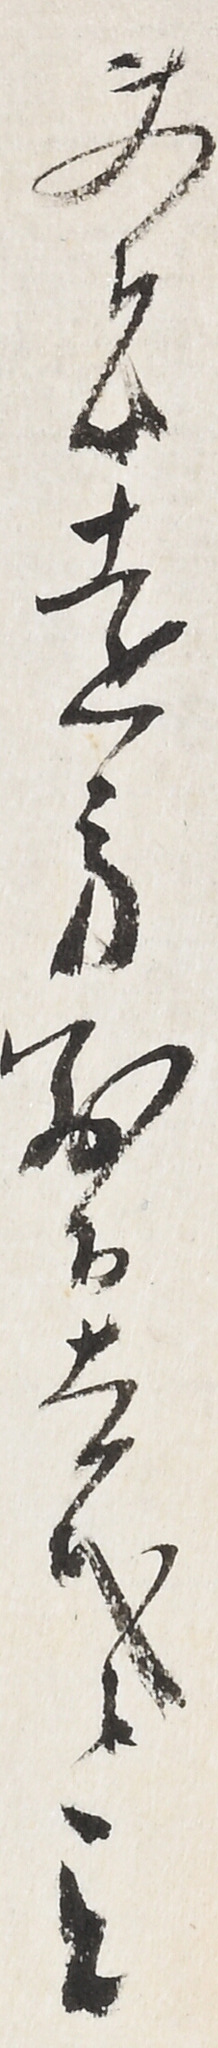夫は遠方別而太義ニ候と
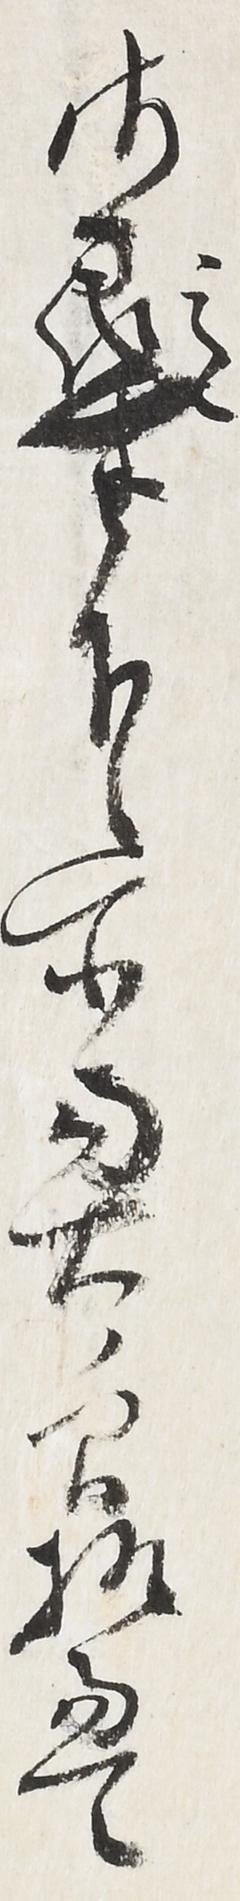御意被下候所奥ノ間拾畳
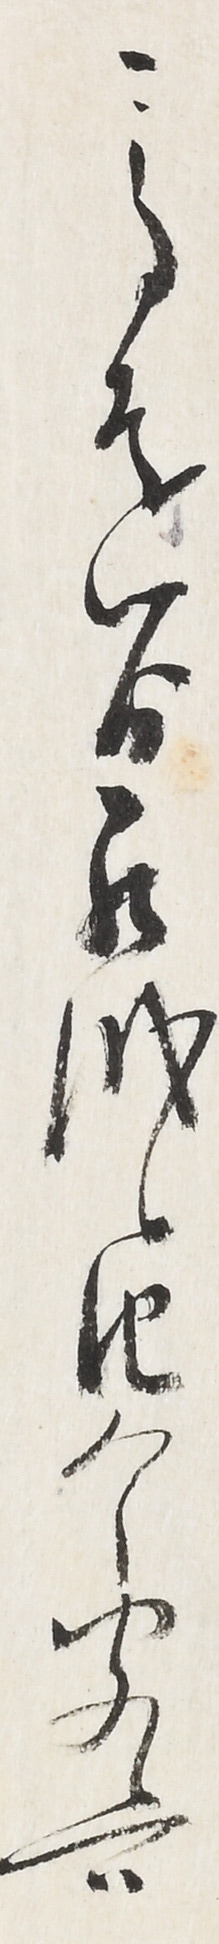高遠ゟ罷越候由今聞候へハ

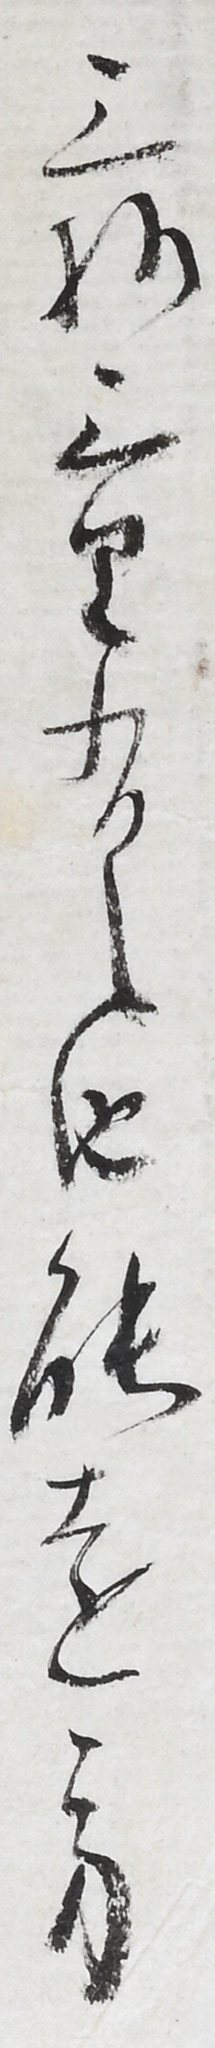三拾三里有之由能遠方
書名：（覚書）
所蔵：伊那市立高遠町図書館・合同会社AMANE
